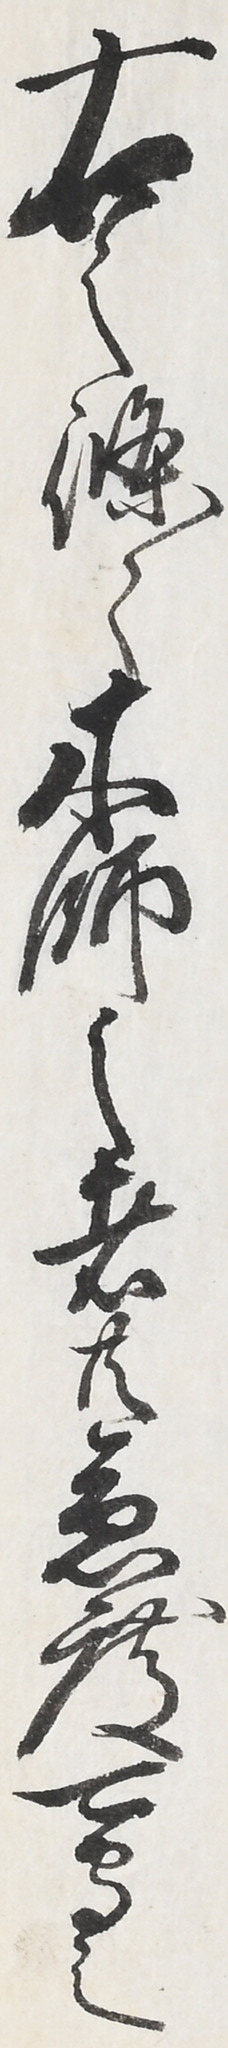右之條々木師之者共急度可守之
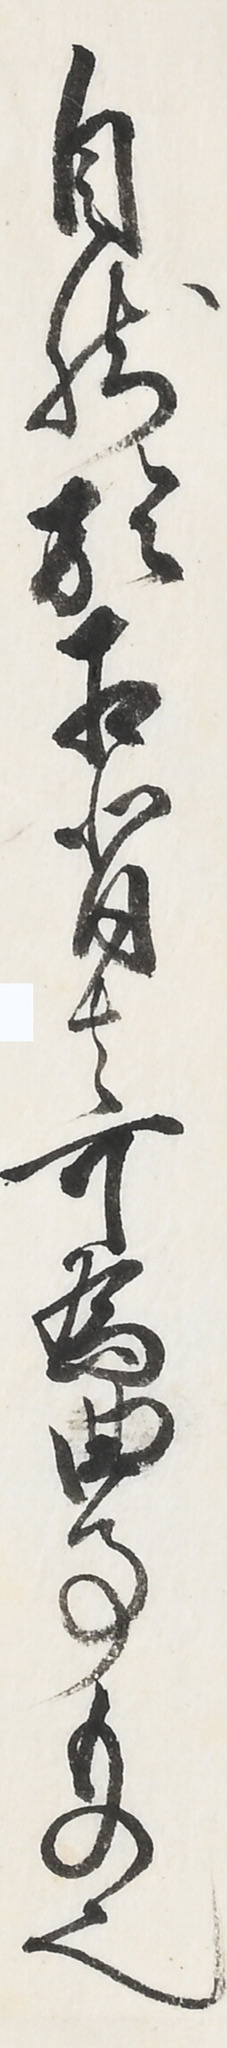自然於相背者可為曲事もの也
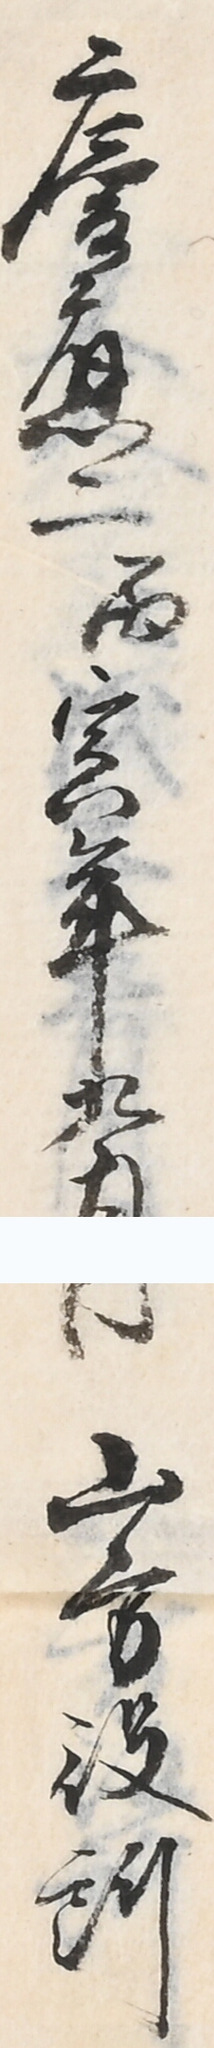慶応二丙寅年九月山方役所
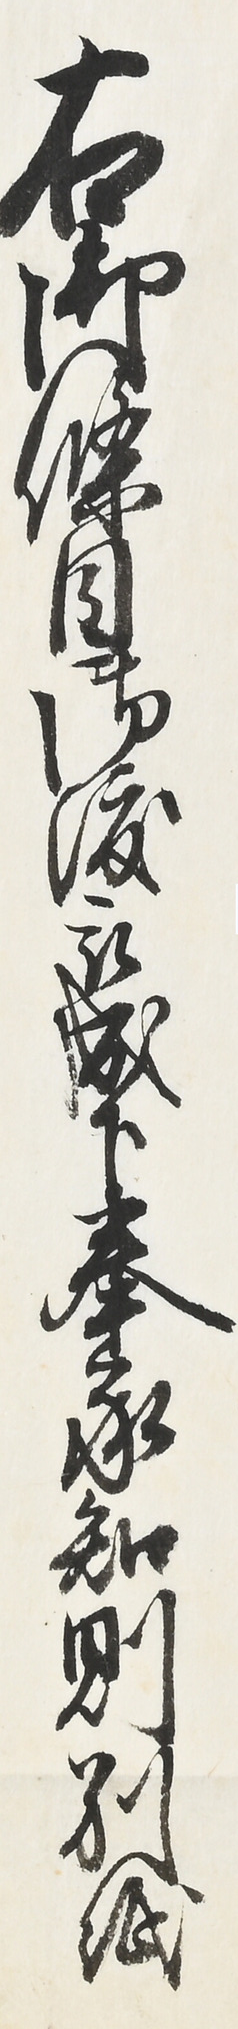右御條目御渡被成下奉承知則別紙
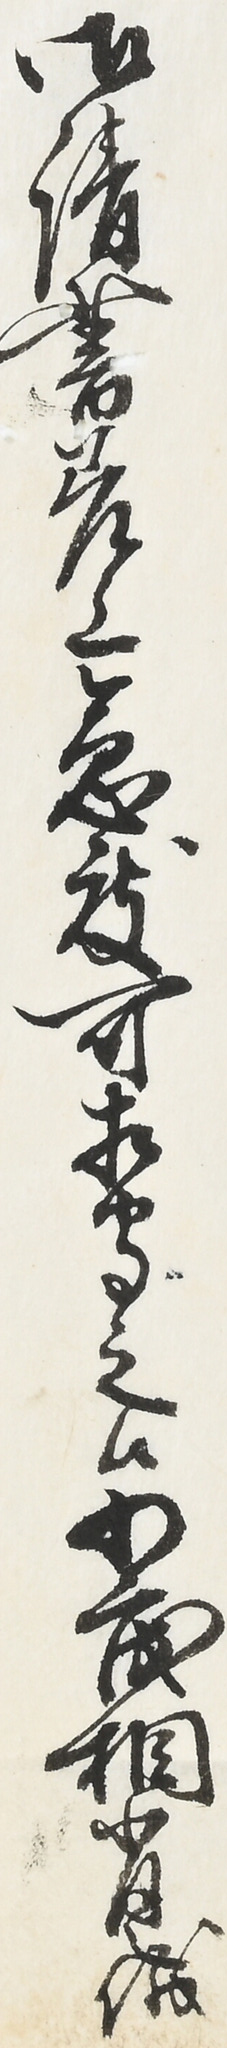請書差上急度可相守之候少茂相背儀

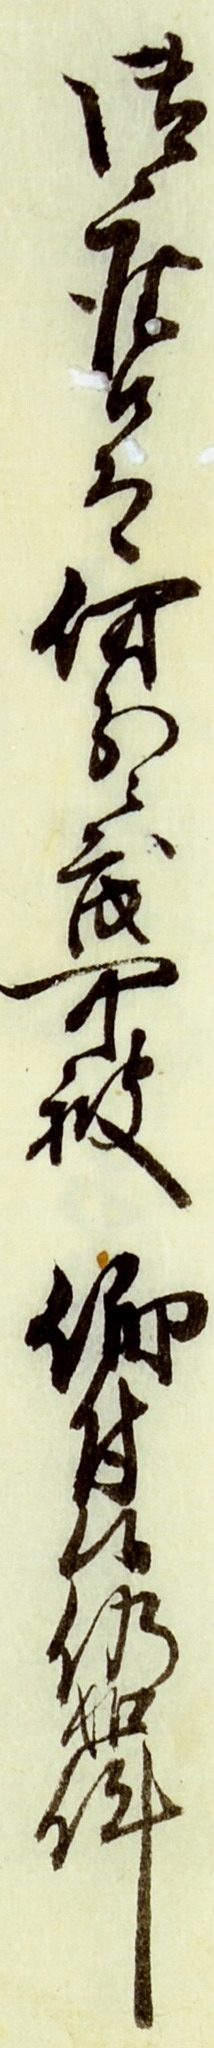御座候ハヽ何分ニ茂可被仰付候仍如件
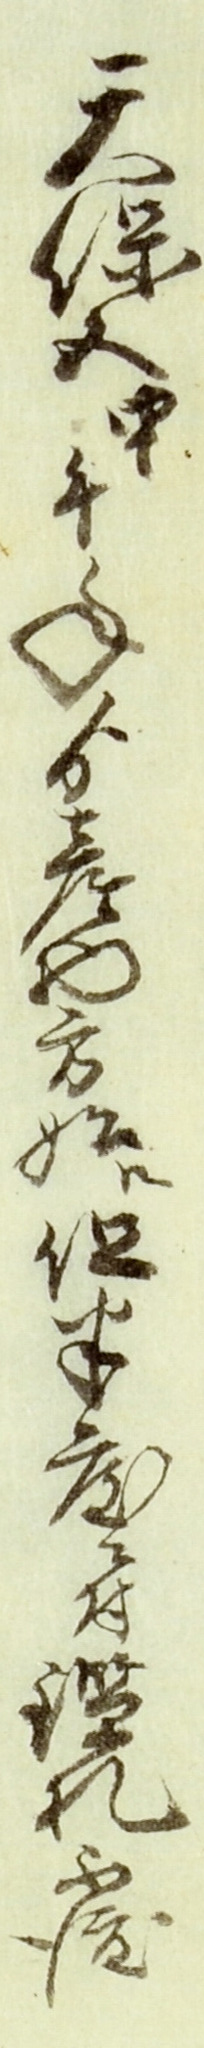天保五甲午年ゟ産物方始ル但半度ニ付鑑札不渡
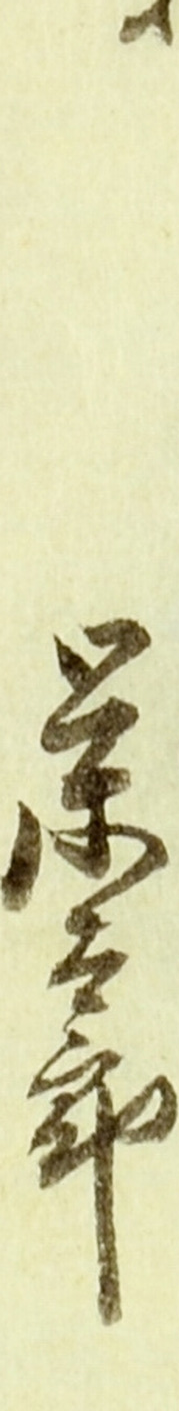栄太郎
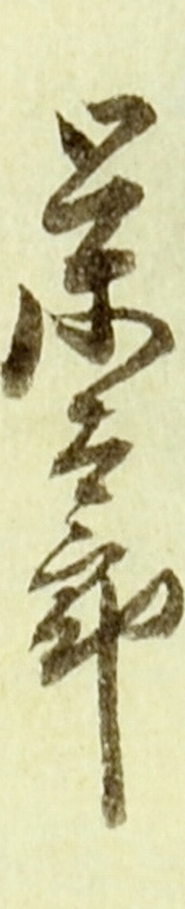栄太郎
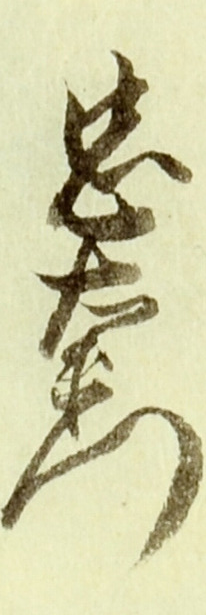忠右衛門
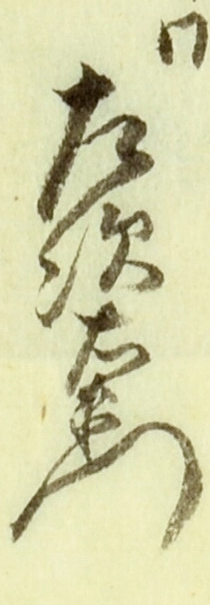左次右衛門
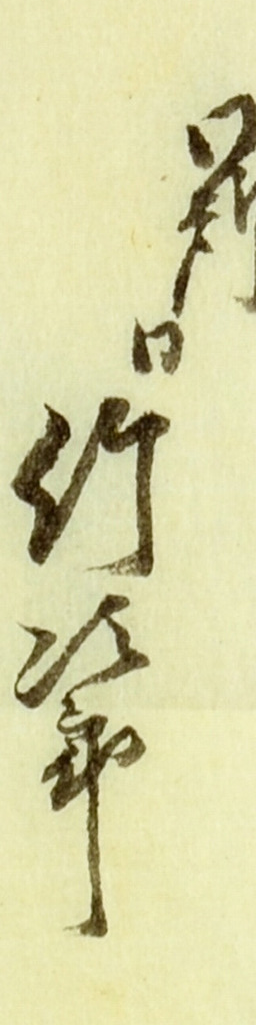竹次郎
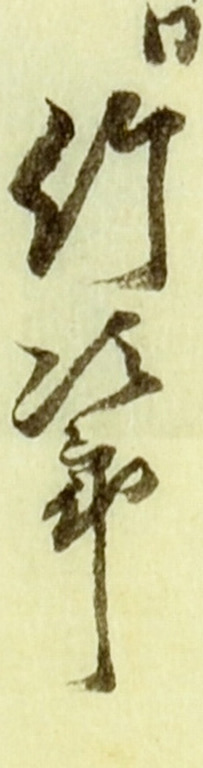竹次郎

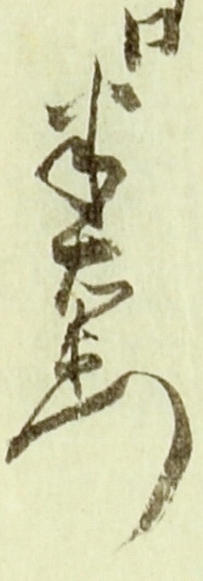半右衛門
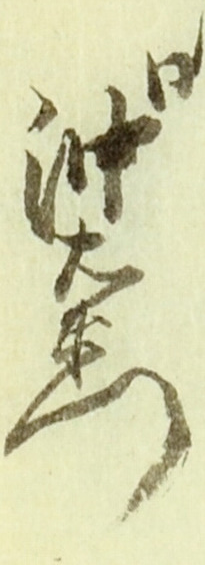沖右衛門
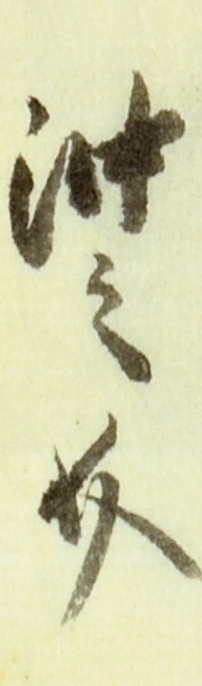沖之介
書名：小白木條目請書并判取帳
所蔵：伊那市立高遠町図書館・合同会社AMANE
